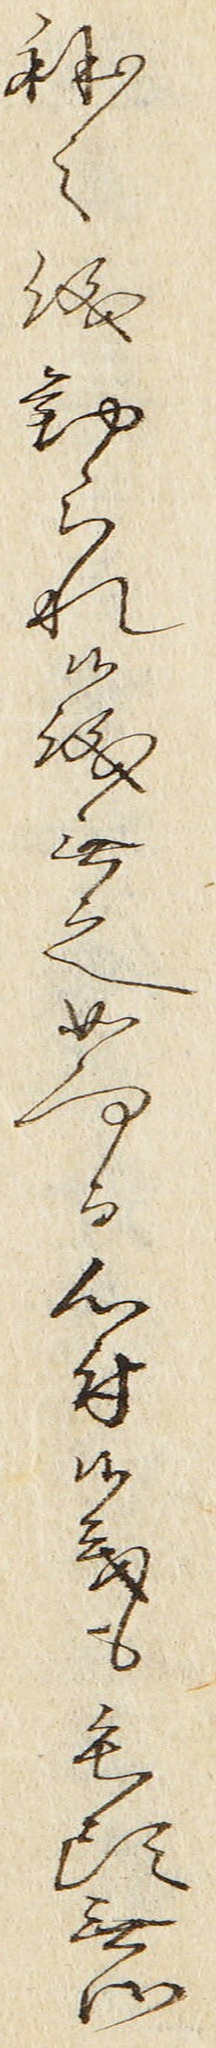躰之儀勧られ候儀無之如何而心付候義も毛頭無御
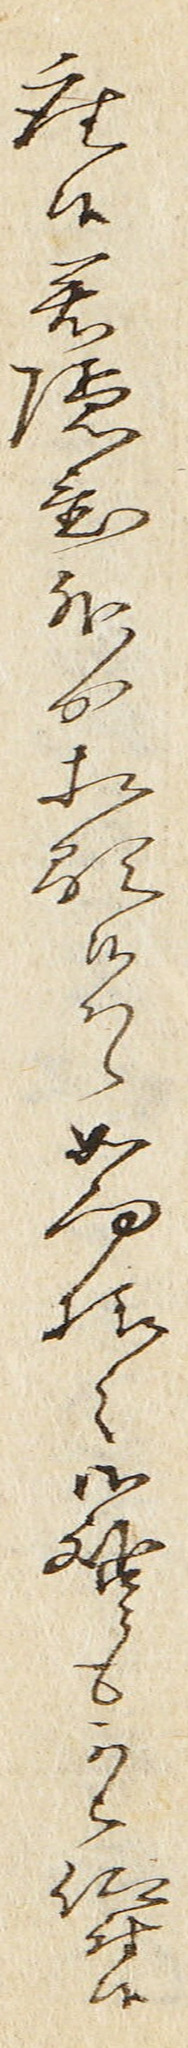座候若隠置外ゟ相顕候はゝ如何様之御咎にも可被仰付候
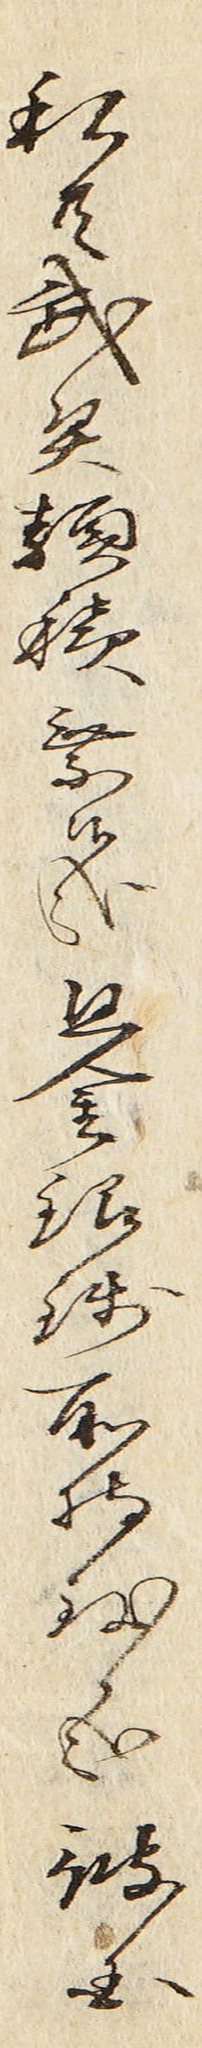一私共武具類積乗候哉且金銀銭所持致哉彼国
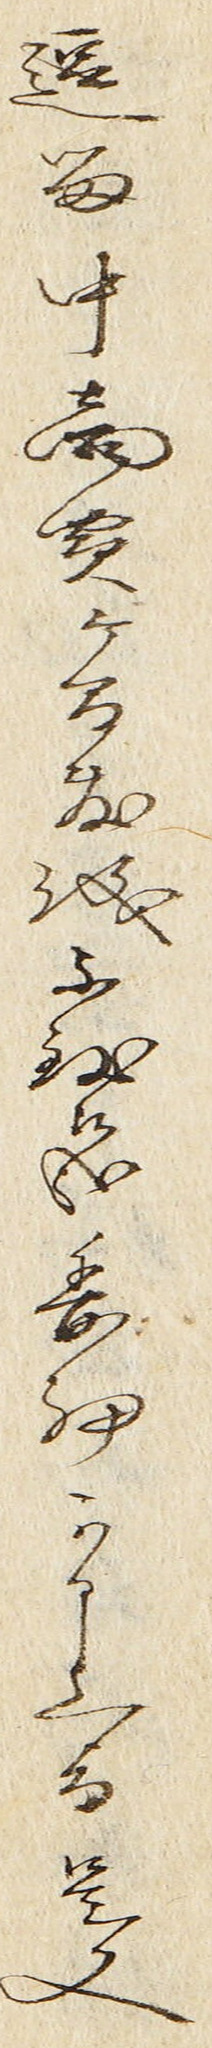逗留中商売ヶ間敷儀不致候哉委細可申上旨是又
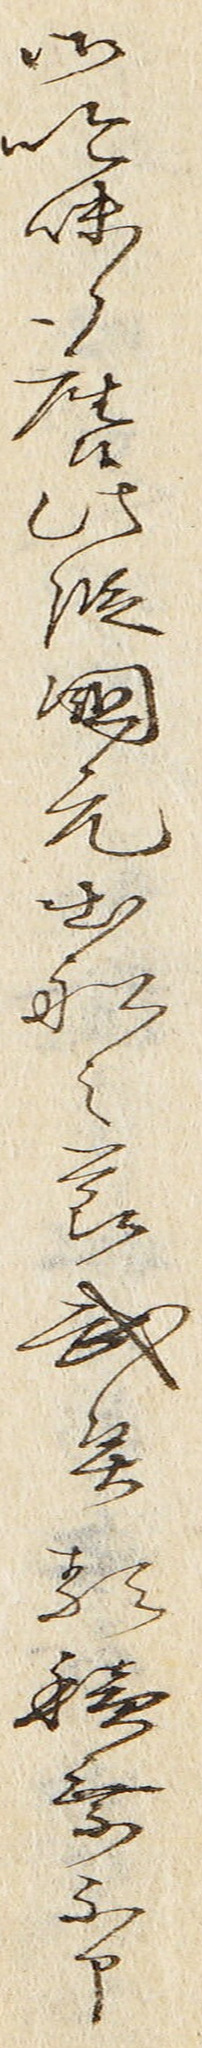御吟味御座候此段国元出船之節武具類積乗不申
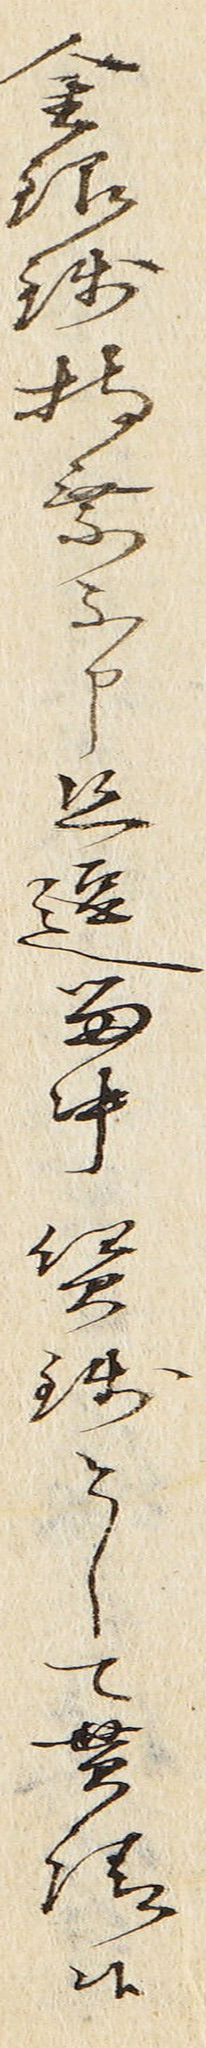金銀銭持乗不申且逗留中賃銭として貰請候
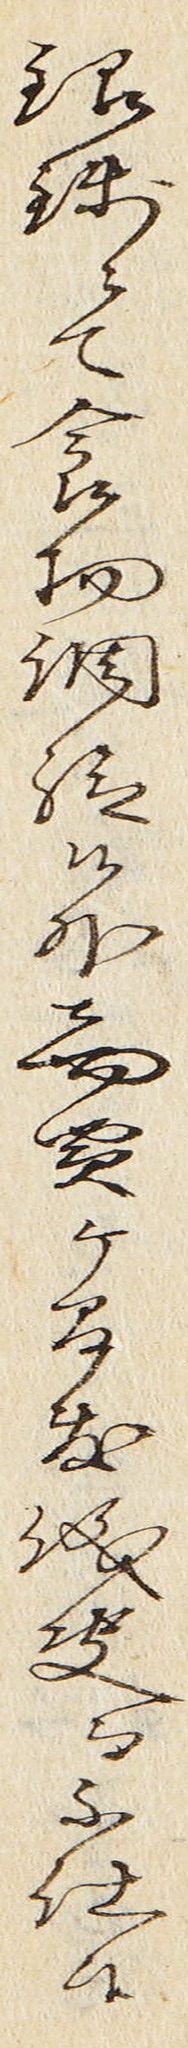銀銭にて食物調給候外商売ヶ間敷儀決而不仕候
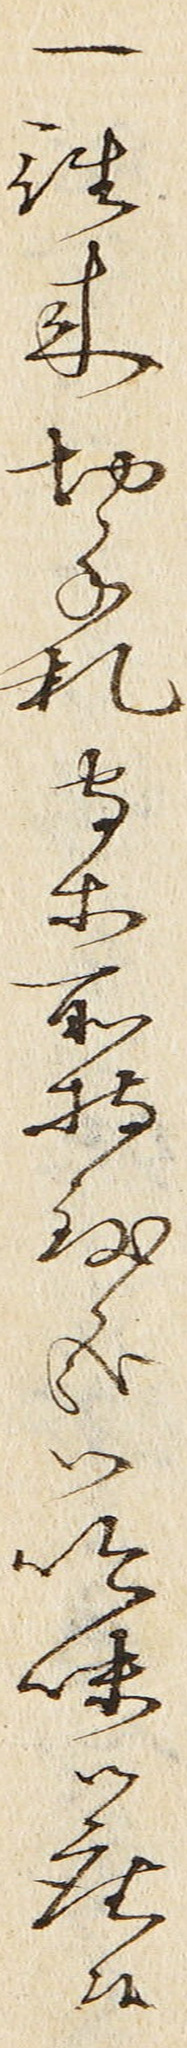一往来切手札守等所持致候哉御吟味御座候
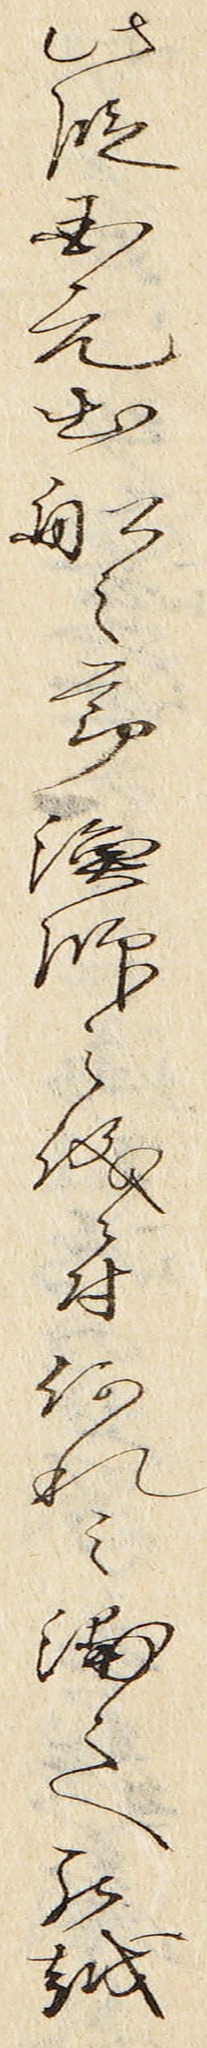此段国元出船之節漁師之儀に付何れの浦々へ罷越
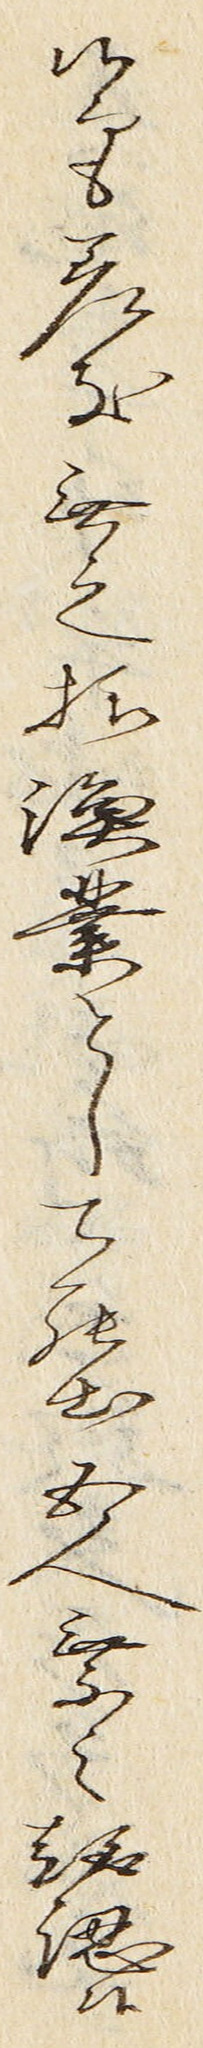候而も差支無之様漁業として罷出五人乗之趣認候
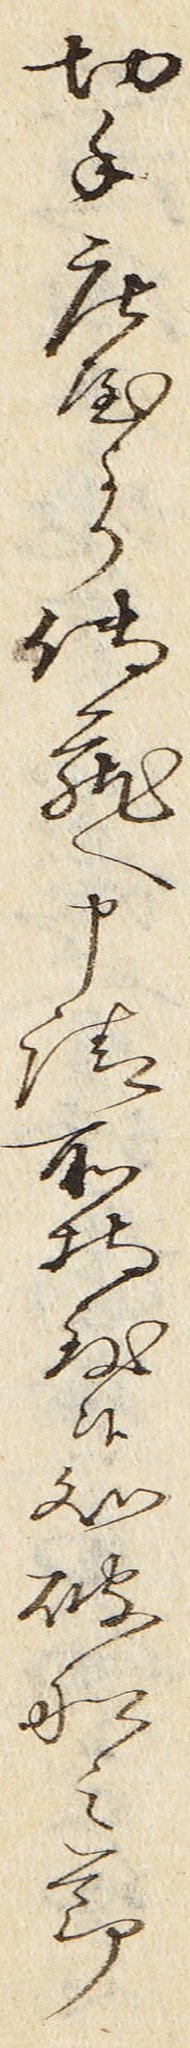切手庄屋より伝蔵へ申請所持致候処破船之節
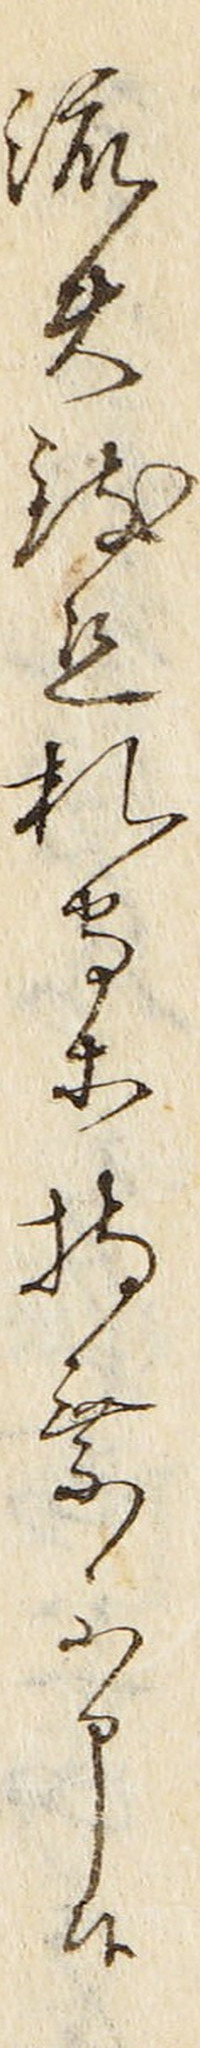流失致且札守等持乗不申候
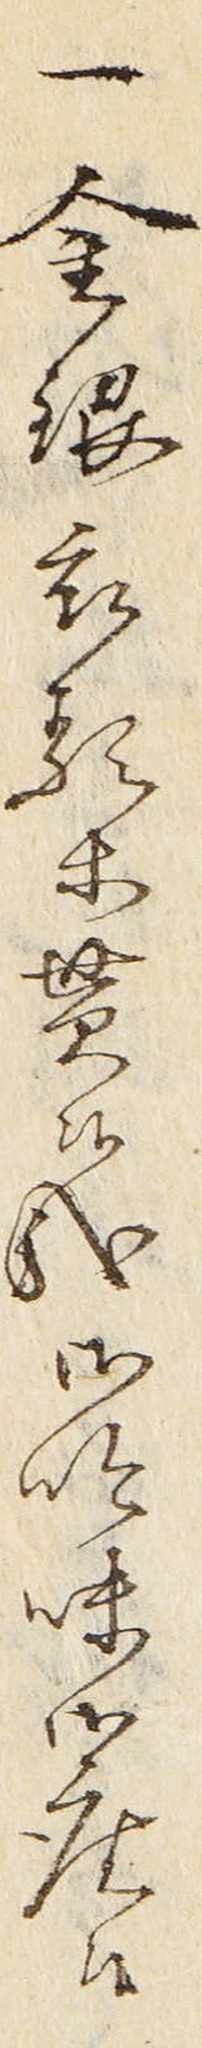一金銀衣類等貰候哉御吟味御座候
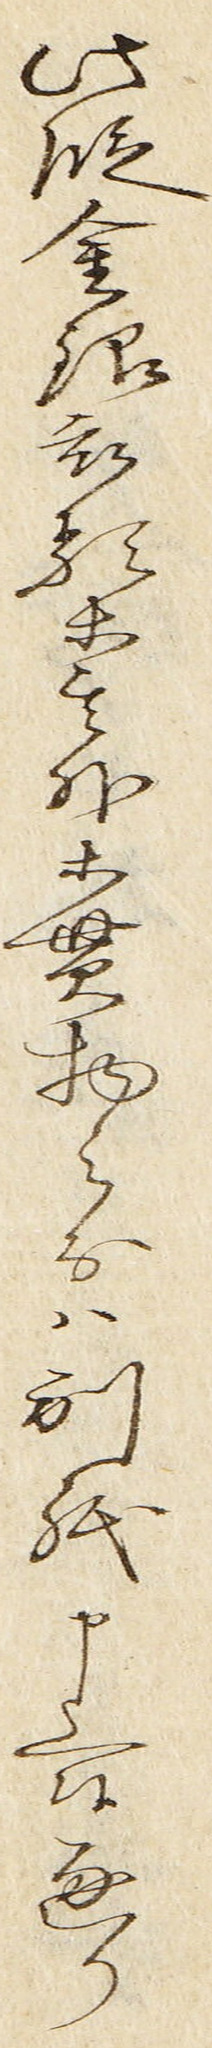此段金銀衣類等其外等貰物之分は別紙申上候通り
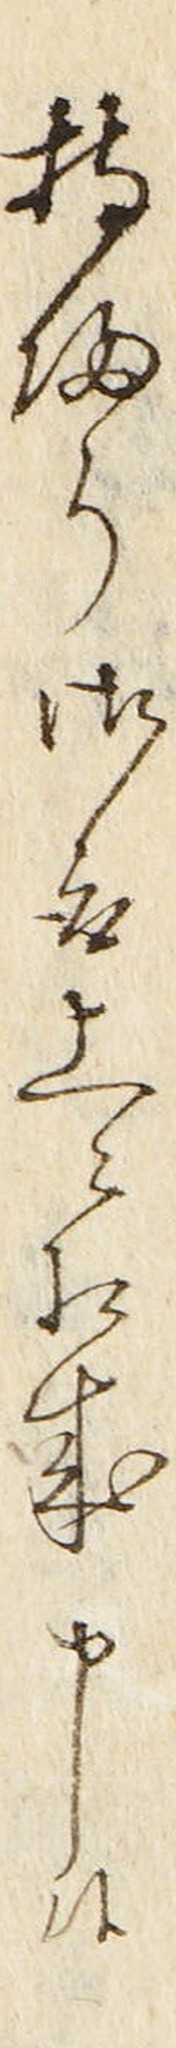持帰り御取上に相成申候
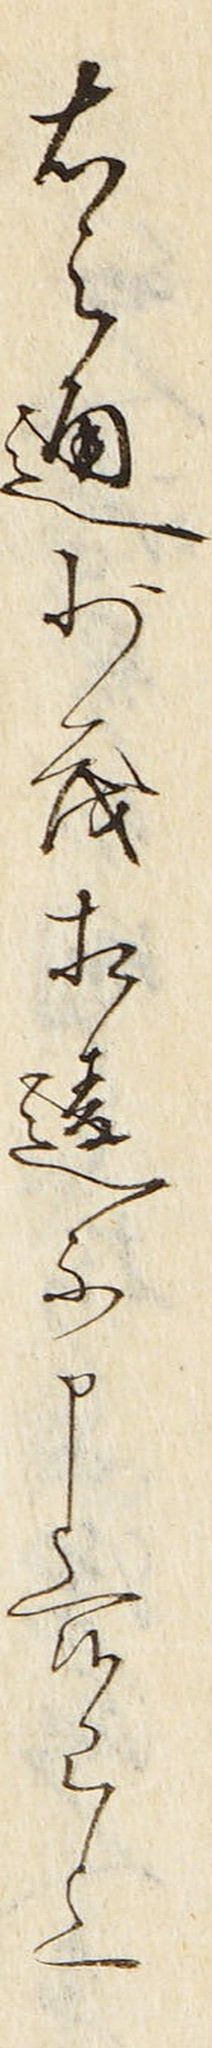右之通少も相違不申上候已上
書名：土佐中浜万次郎漂流記
